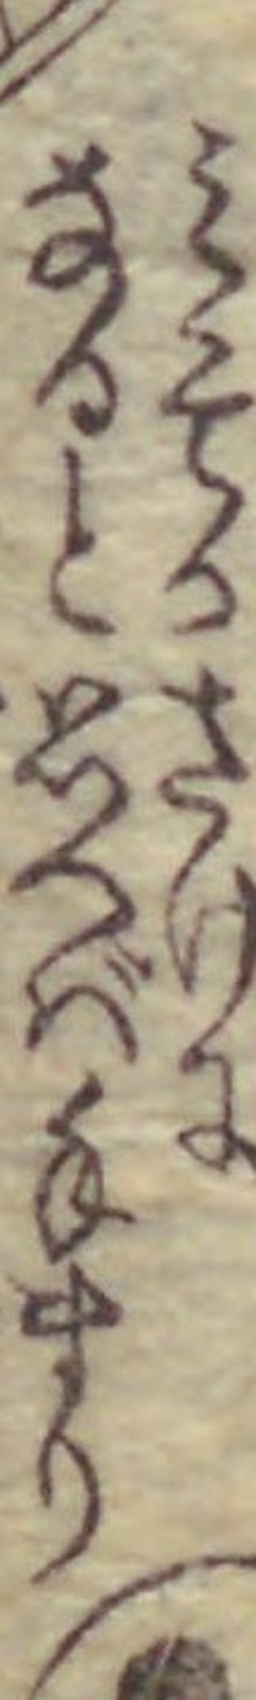なると思へば手まり
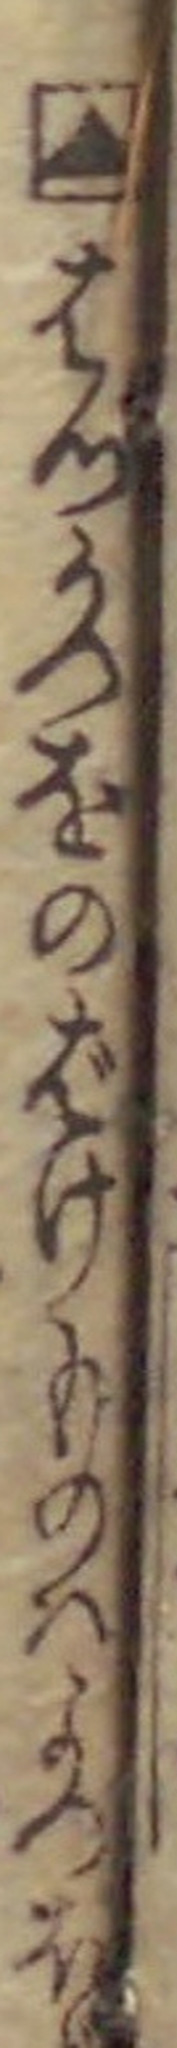◆はつかつをのばけものはよつほど
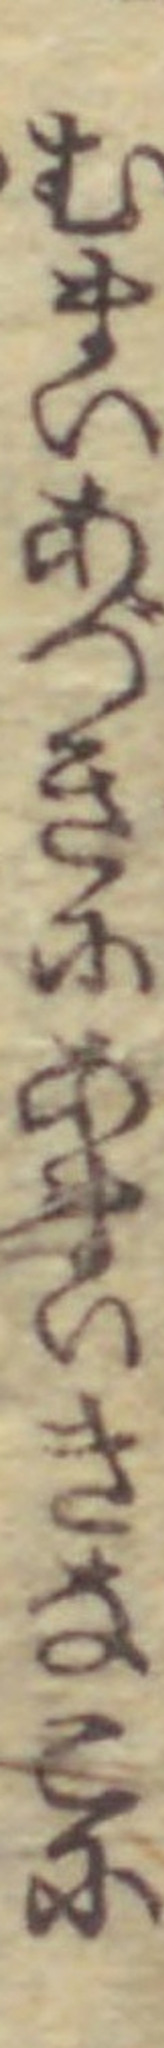むまいあづきにあまいきなこに
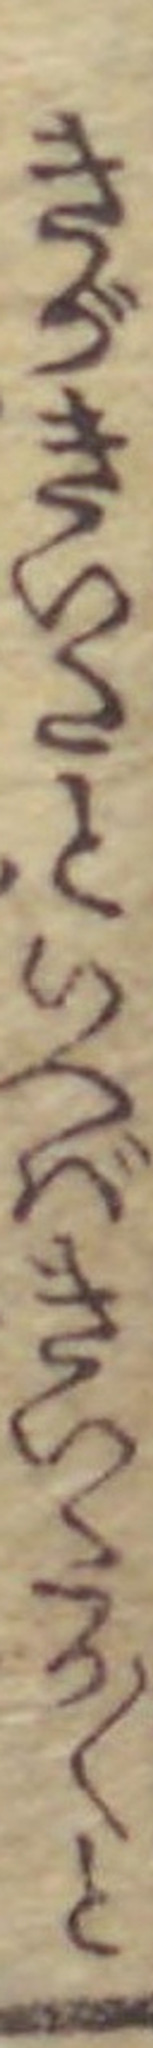きがきいたといへばきいたか〳〵と
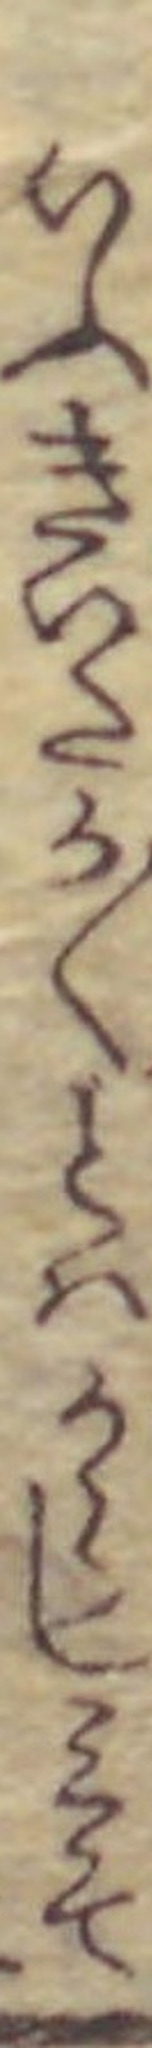いふきいたか〳〵とはからしみそ
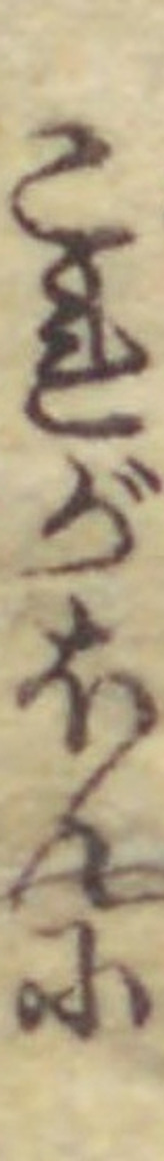これがほんに
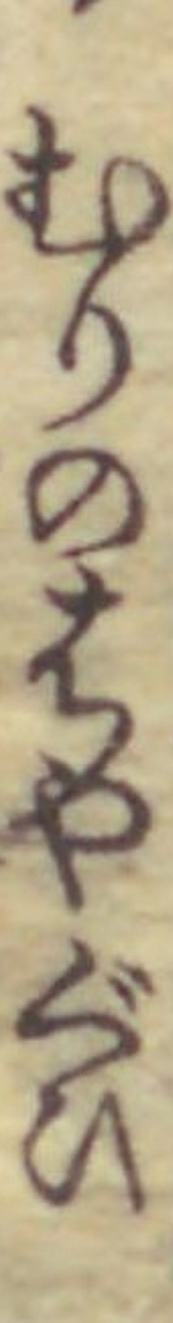むりのはやぐひ
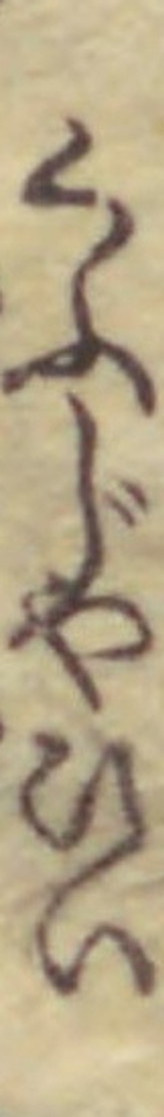くふじやひい
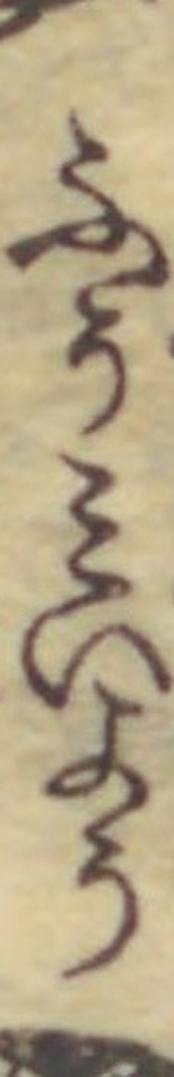ふうみいよう
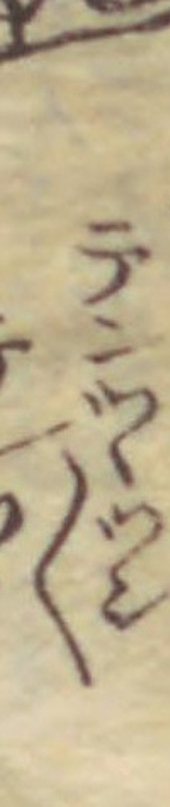テンツヽツン
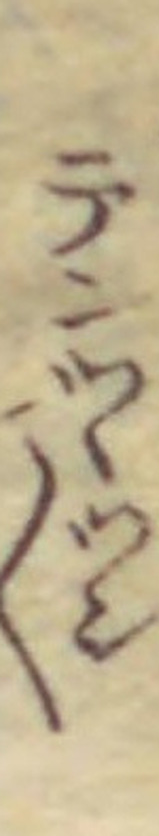テンツヽツン
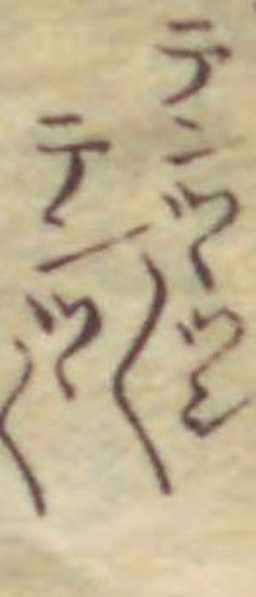テンツヽツン
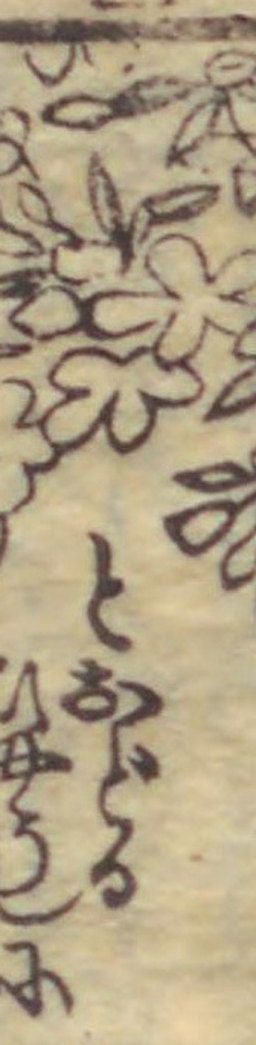とおどる
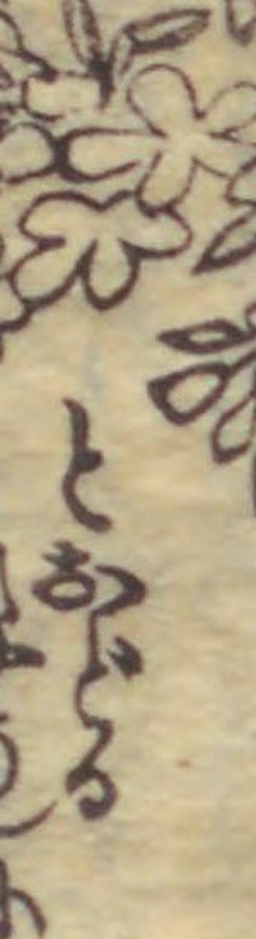とおどる
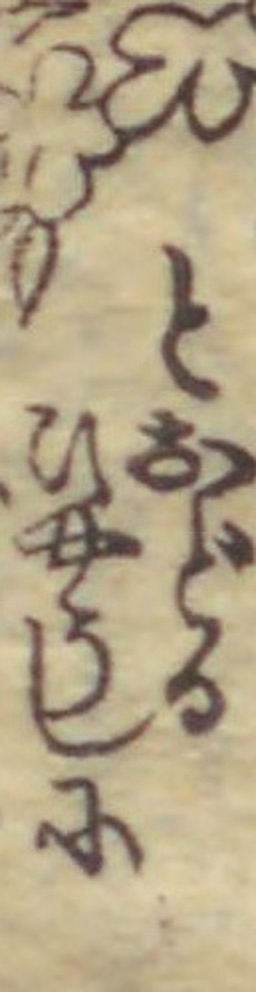ひやうしに
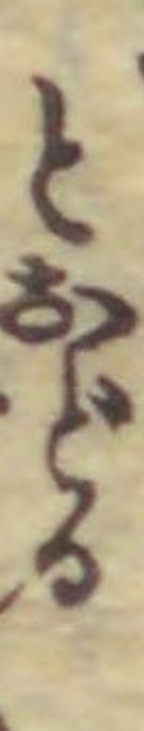とおどる
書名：大時代唐土化物 3巻. 曽我太夫染
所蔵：国立国会図書館 National Diet Library, JAPAN
